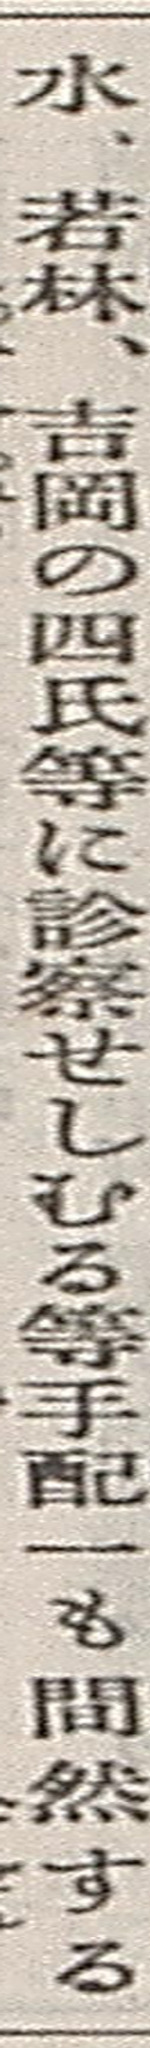水、若林、吉岡の四氏等に診察せしむる等手配一も間然する
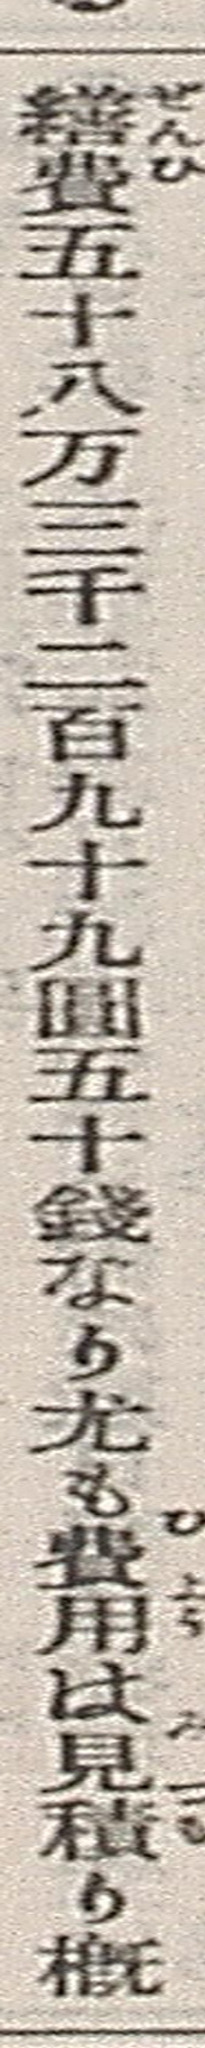繕費五十八万三千二百九十九円五十銭なり尤も費用は見積り概
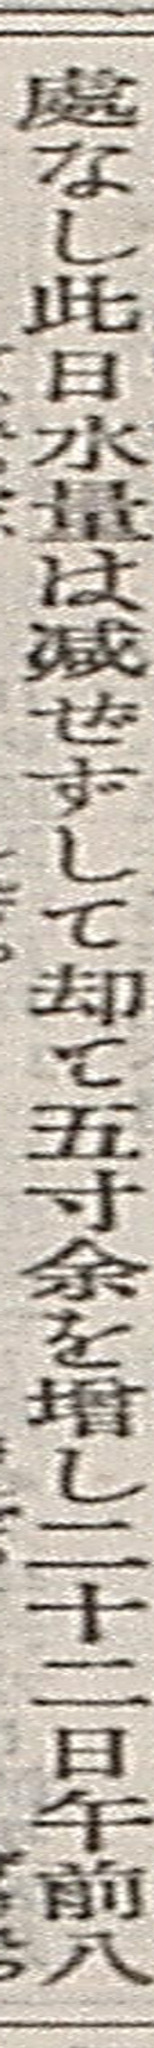処なし此日水量は減せずして却て五寸余を増し二十二日午前八
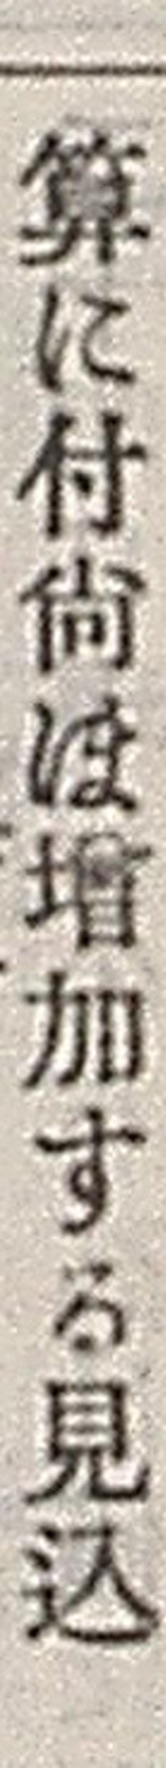算に付尚ほ増加する見込み
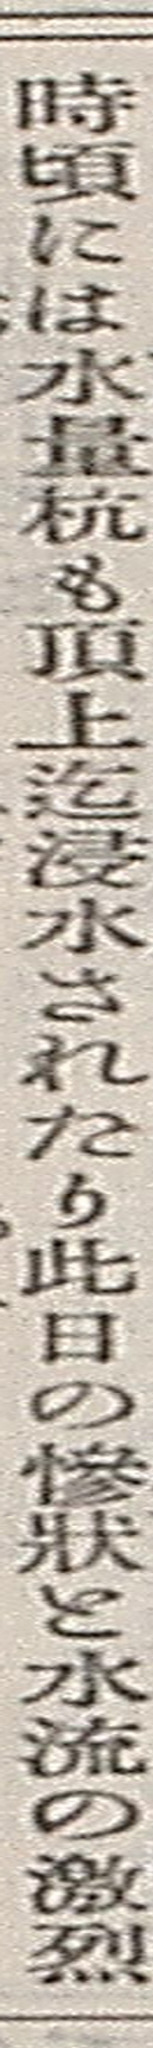時頃には水量杭も頂上迄浸水されたり此日の惨状と水流の激烈
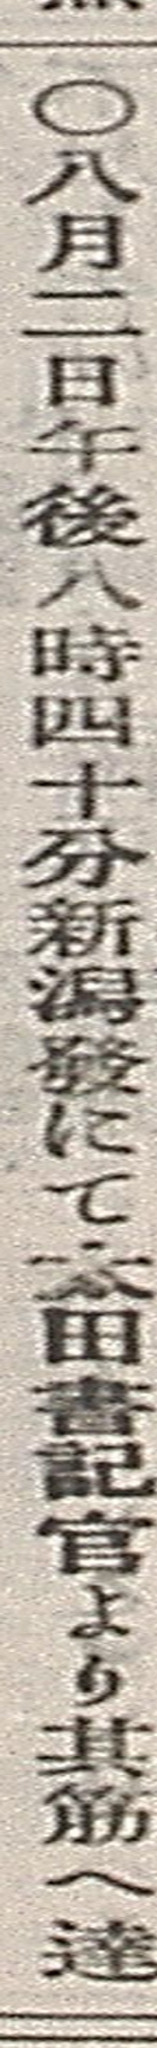○八月二日午後八時四十分新潟発にて太田書記官より其筋へ達
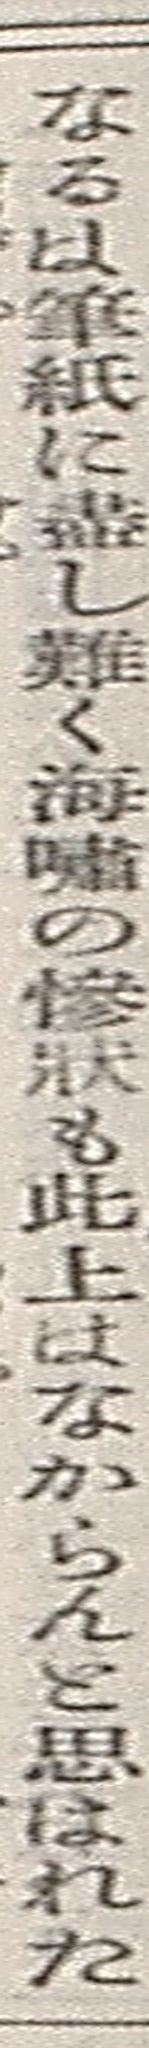なるは筆紙に盡し難く海嘯の惨状も此上はなからんと思はれた
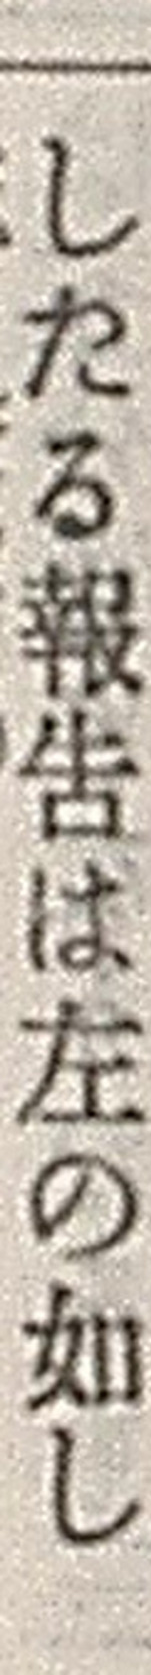したる報告は左の如し
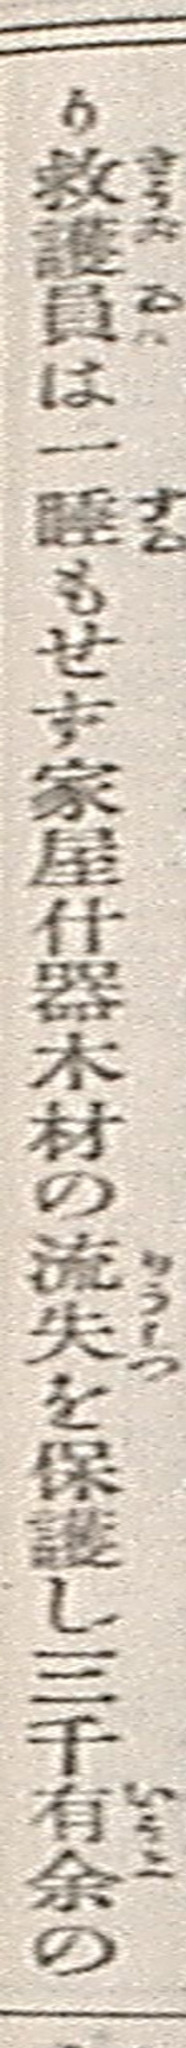り救護員は一睡もせず家屋什器木材の流失を保護し三千有余の
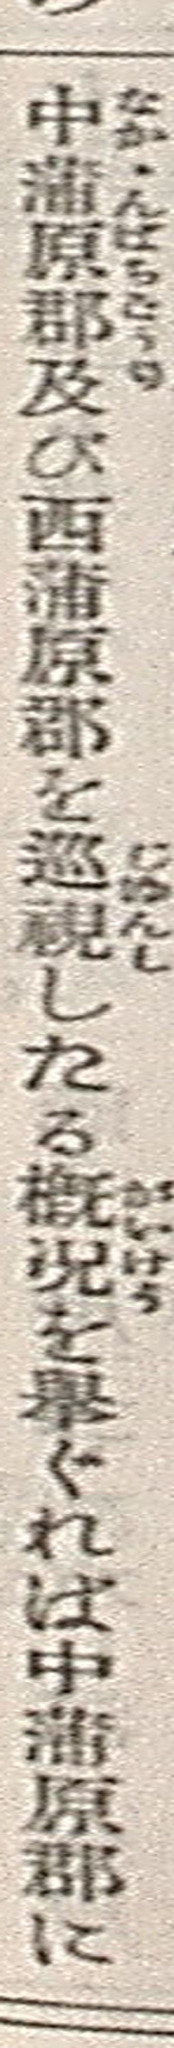中蒲原郡及び西蒲原郡を巡視したる概況を挙ぐれば中蒲原郡に

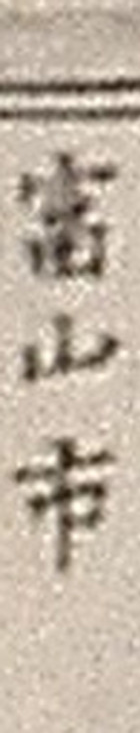富山市
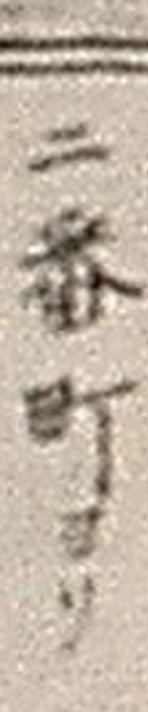二番町ヨリ
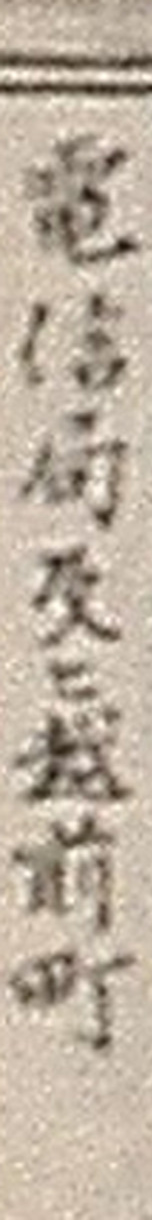電信局及ヒ越前町
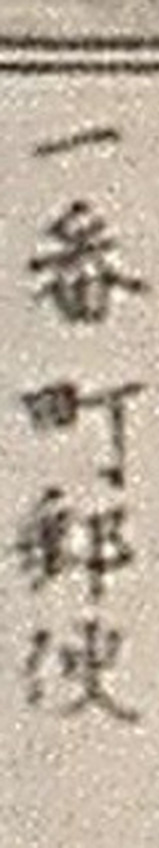一番町郵便
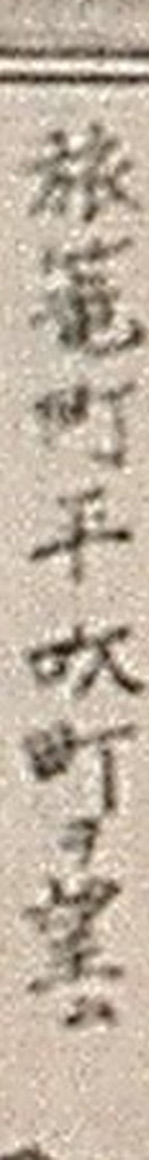旅篭町平吹町ヲ望ム
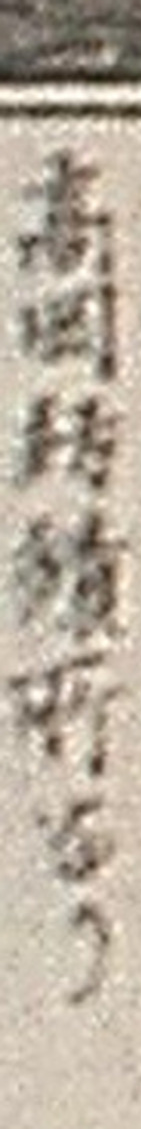高岡紡績所なり
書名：風俗畫報臨時増刊第百二十八號　洪水被害録（下）
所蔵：東京大学地震研究所図書室 Earthquake Research Institute Library, The University of Tokyo, JAPAN
